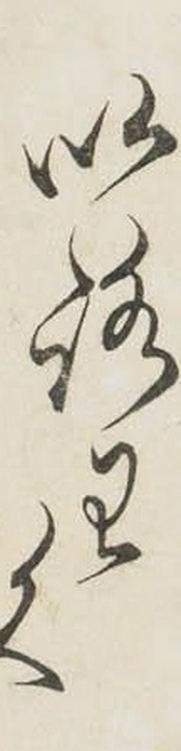いろわく
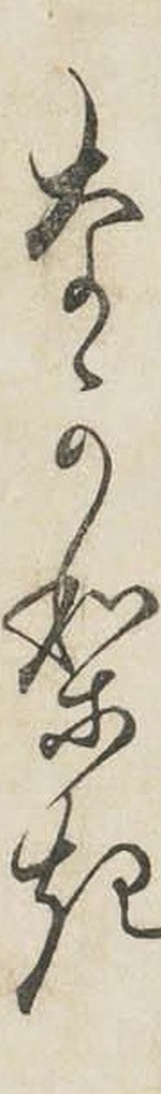なかりき

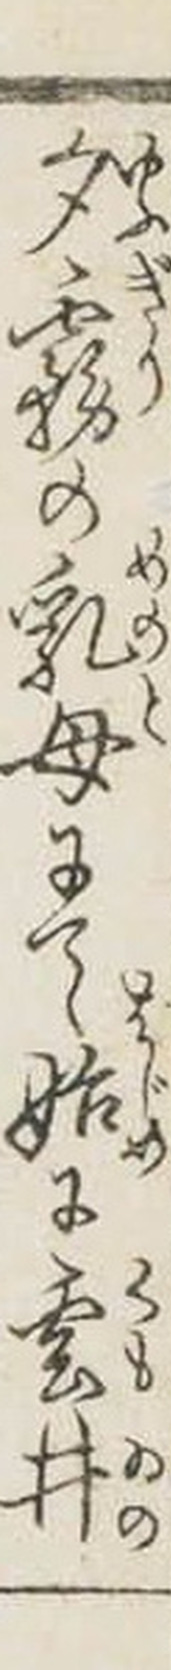夕霧の乳母にて始に雲井
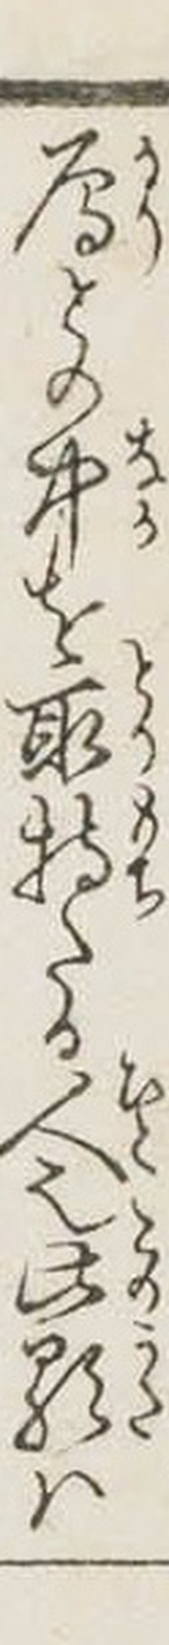鳫との中を取持たる人也此歌は
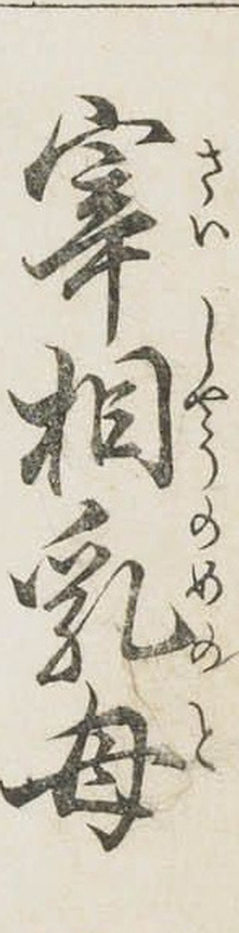宰相乳母
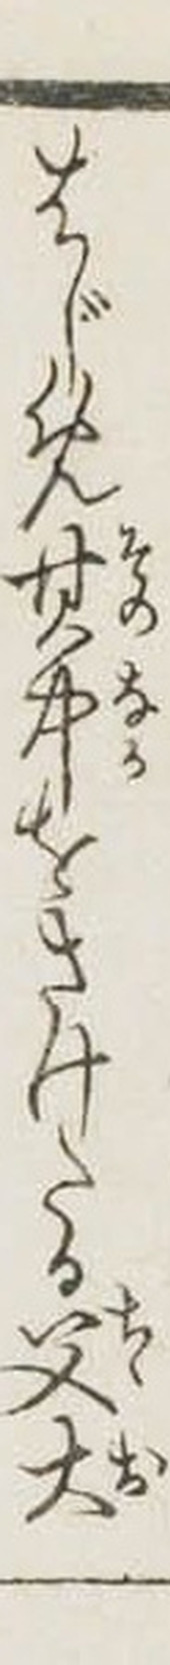はじめ其中をさけたる父大
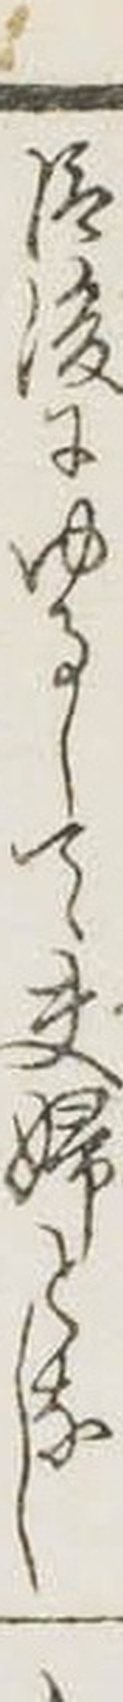臣後にゆるして夫婦となし
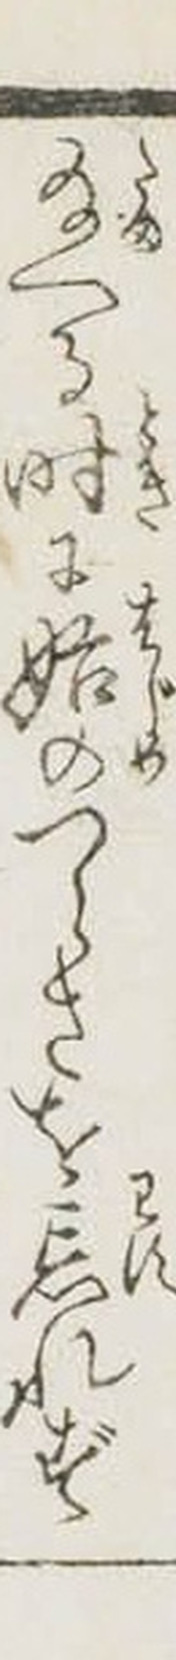給へる時に始のつらさを忘れず
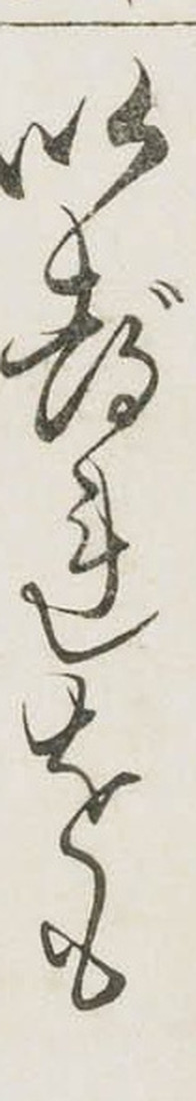いづれをも
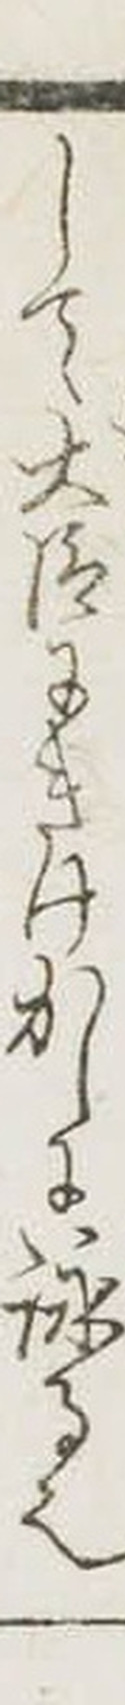して大臣にきけかしに詠る也
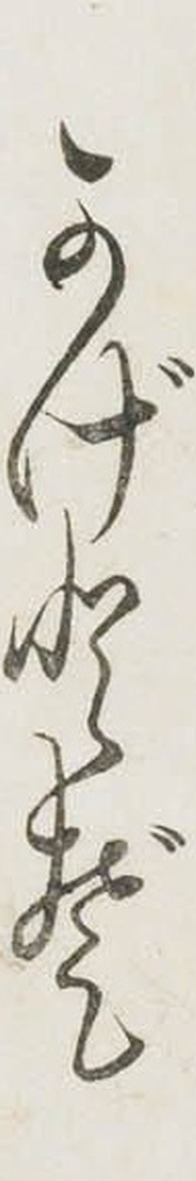かげとぞ
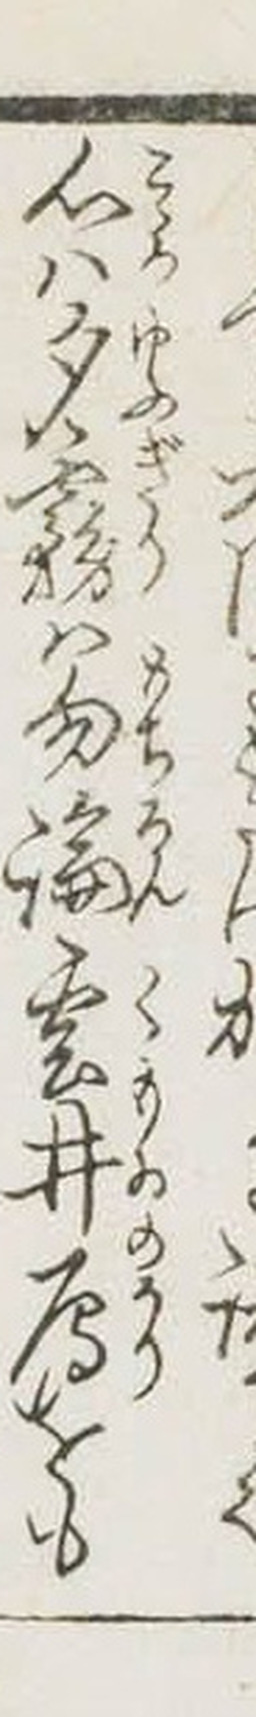心は夕霧は勿論雲井鳫をも
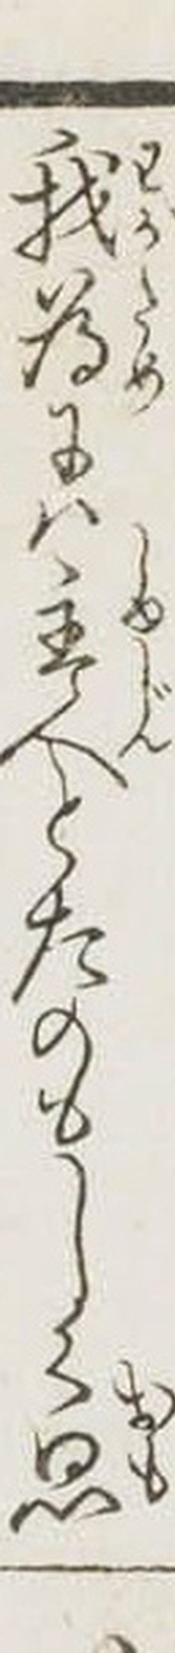我為には主人とたのもしく思
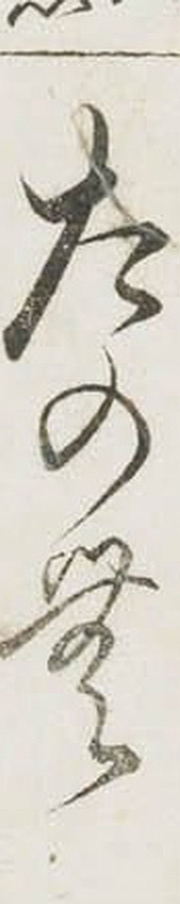たのむ
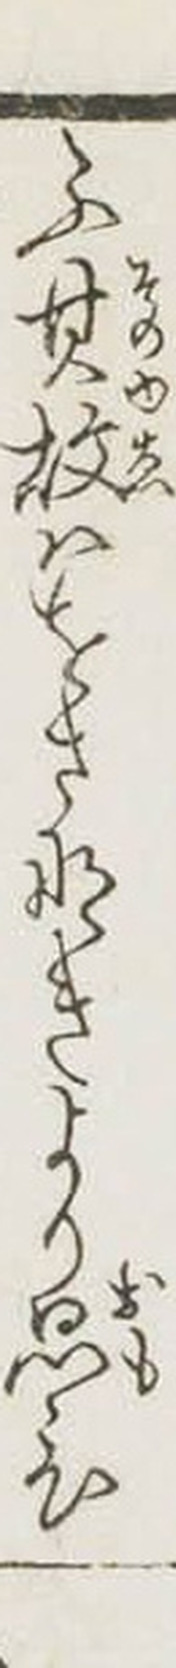ふ其故はをさなきより思ひ
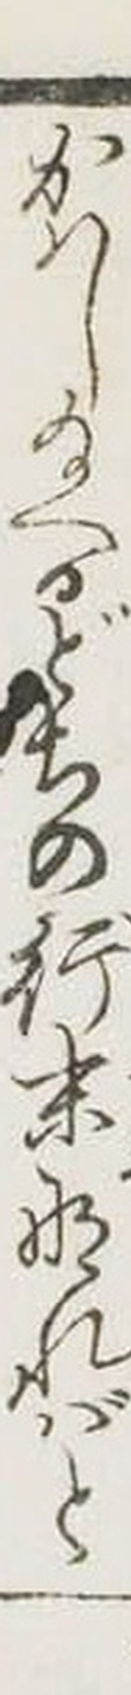かはし給へるどちの行末なればと
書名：源氏百人一首
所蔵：東京学芸大学教育コンテンツアーカイブ
